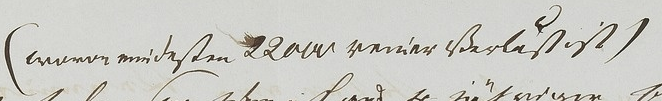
(wovon mindesten 22000 reiner Verlust ist)
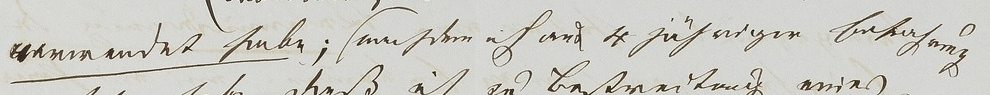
verwendet habe; (nachdem ich aus 4jähriger Erfahrung
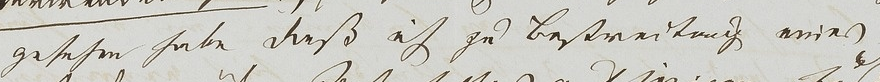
gesehen habe daß ich zu Bestreitung eines
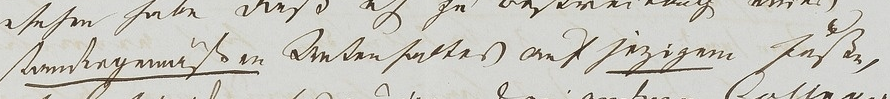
standesgemäßen Unterhaltes auf jezigem Fuße,
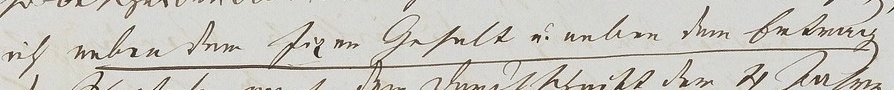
ich neben dem fixen Gehalt u.neben dem Betrag
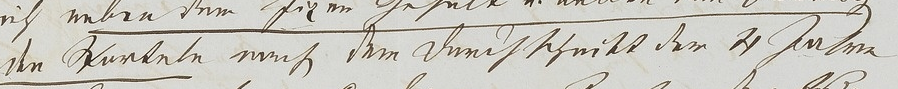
der Sporteln nach dem Durchschnitt der 4 Jahre
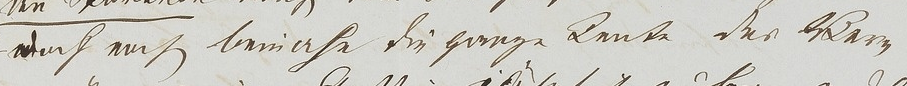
doch noch beinahe die ganze Rente des Ver-
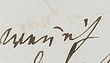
wenn ich
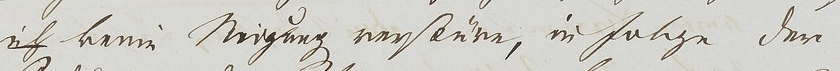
daher keine Neigung verspüre, in Folge der
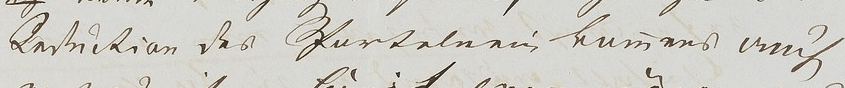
Reduction des Sportelneinkommens auch
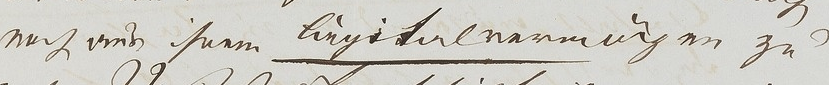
noch aus ihrem Capitalvermögen zu
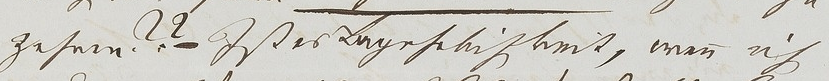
zehren?? – Wes Begehrlichkeit, wenn ich
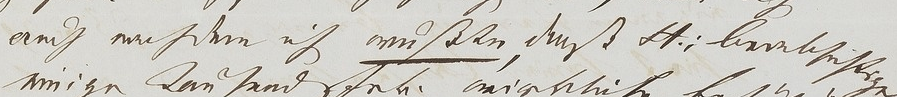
auch nachdem ich wußte, daß St.i beabsichtige
